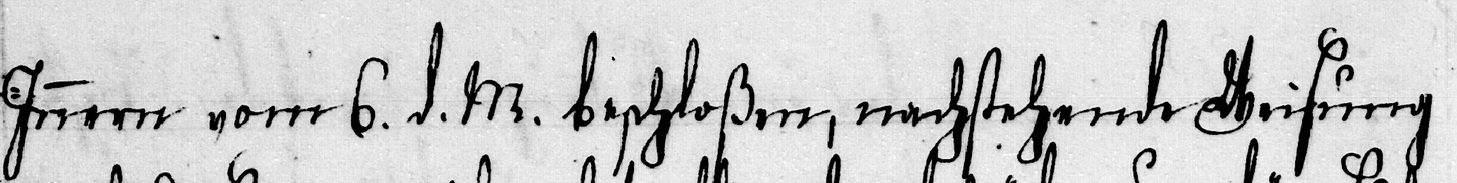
Innern vom 6. d. M. beschloßen, nachstehende Weisung
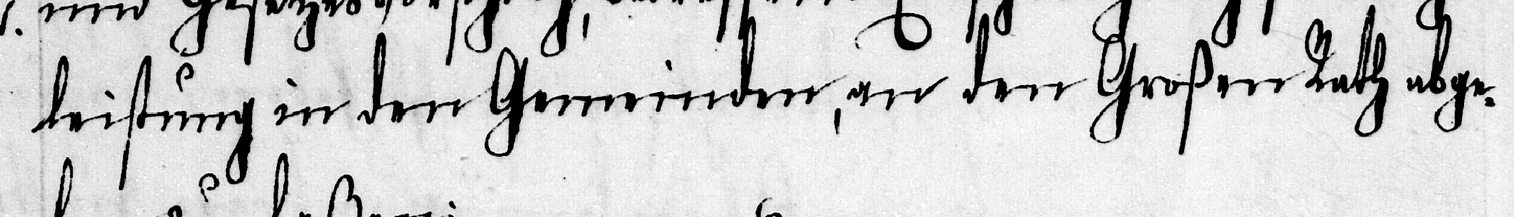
leistung in den Gemeinden, an den Großen Rath abge¬
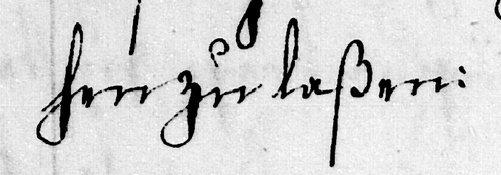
hen zu laßen:
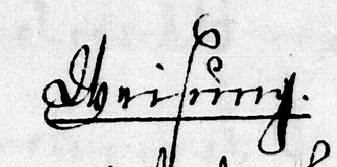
Weisung.
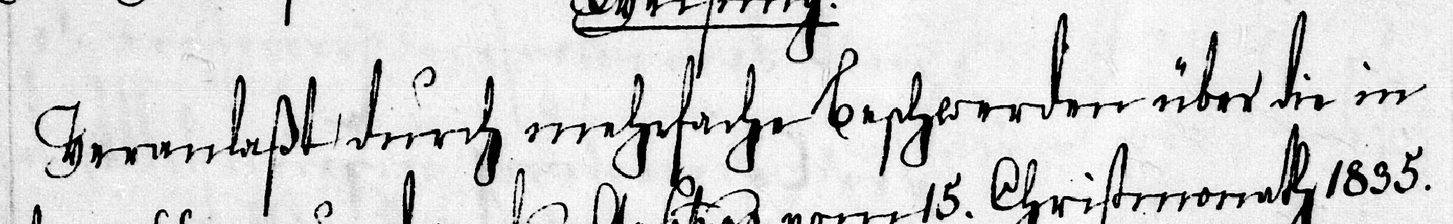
Veranlaßt durch mehrfache Beschwerde über die in
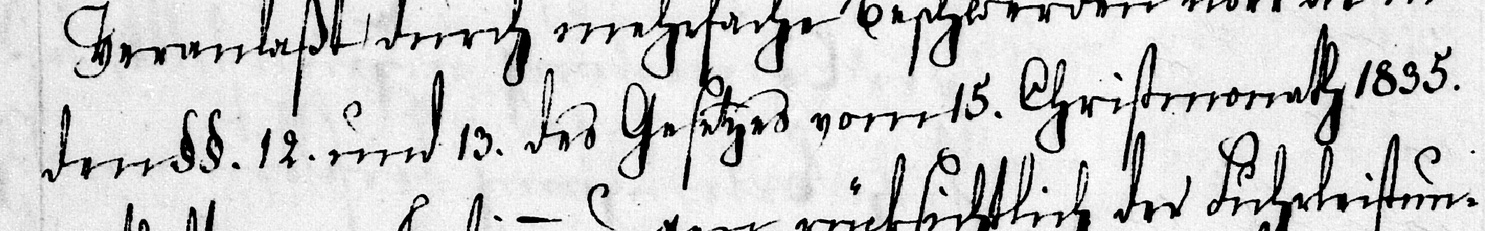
den §§. 12. und 13. des Gesetzes vom 15. Christmonath 1835.
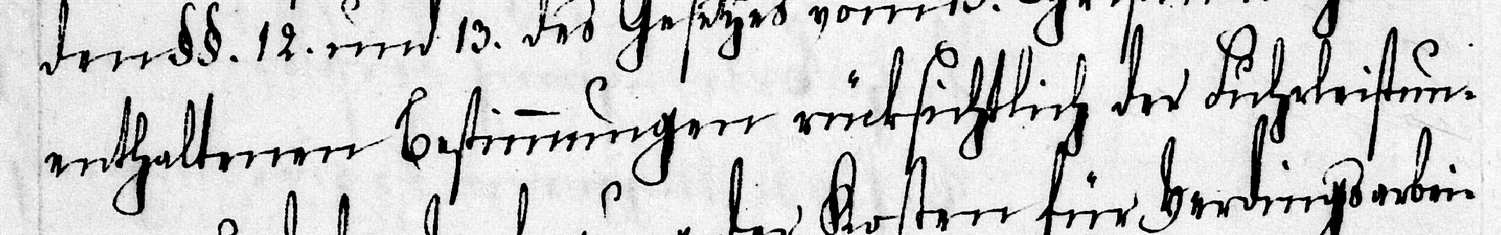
enthaltenen Bestimmungen rücksichtlich der Fuhrleistun¬
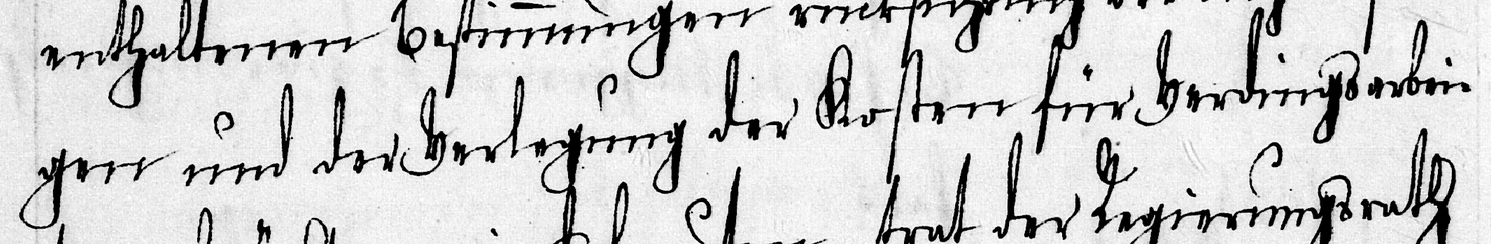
gen und der Verlegung der Kosten für Verdingsarbei¬
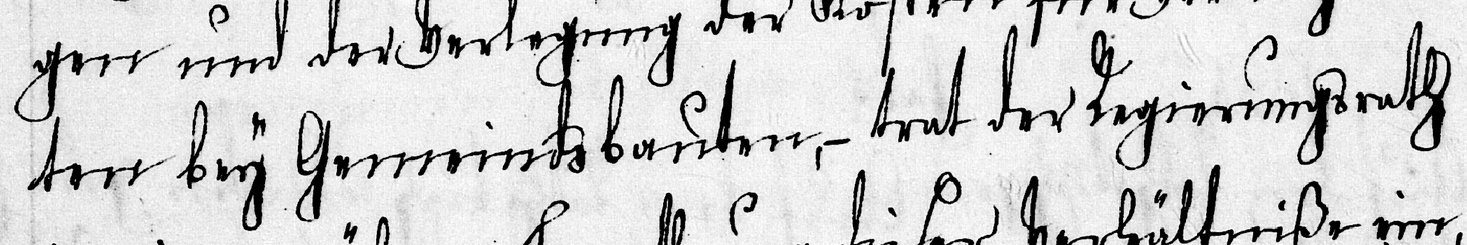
ten bey Gemeindsbauten, – trat der Regierungsrath
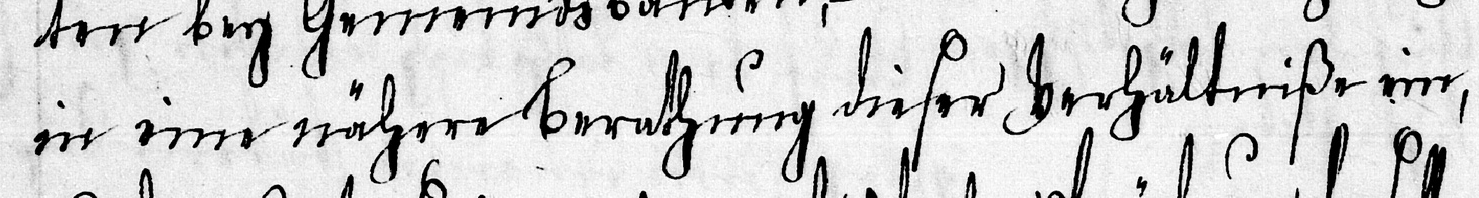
in eine nähere Berathung dieser Verhältniße ein,
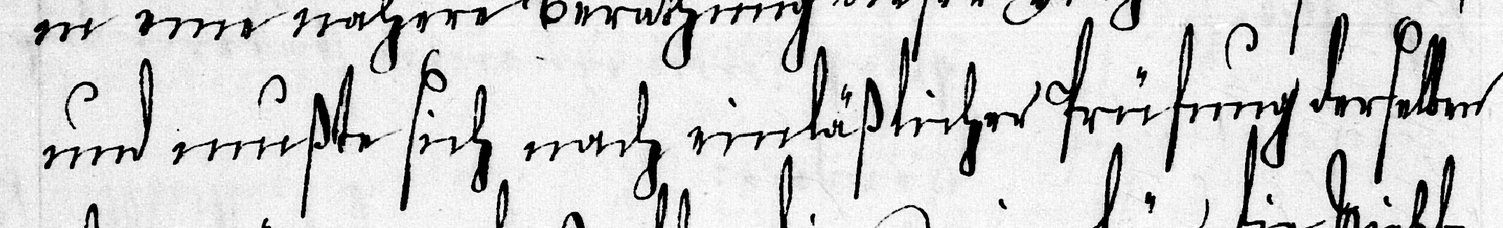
und mußte sich nach einläßlicher Prüfung dersel¬
